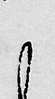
n.
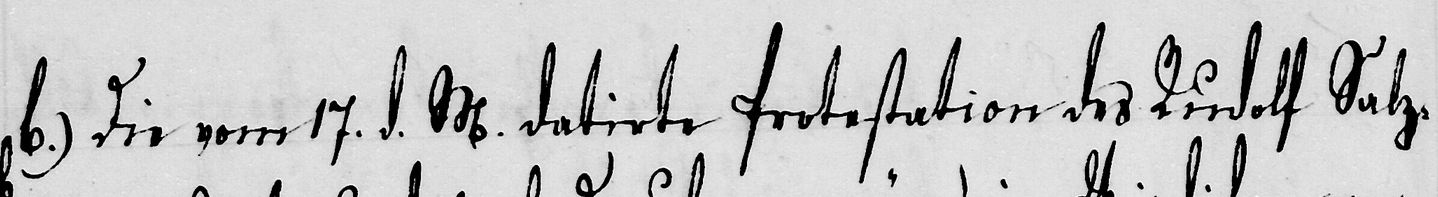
b.) Die vom 17. d. M. datirte Protestation des Rudolf Salz¬
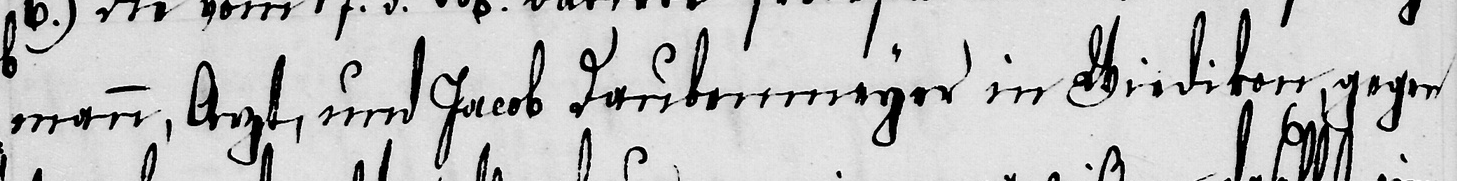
mann, Arzt, und Jacob Daubenmeyer in Wiedikon, gegen
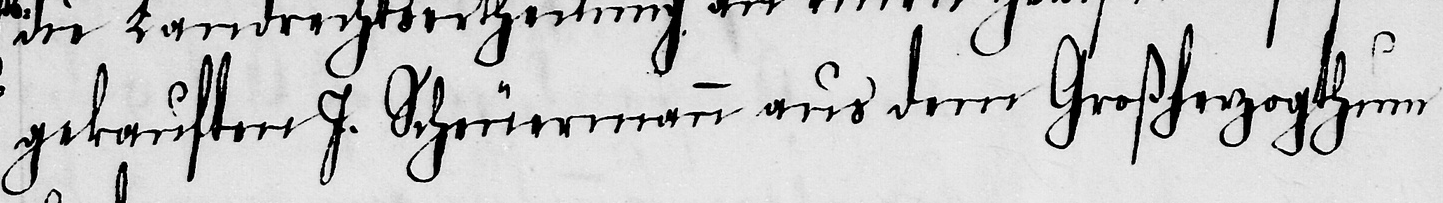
gekauften J. Scheuermann aus dem Großherzogthum
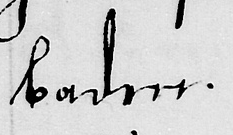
Baden.
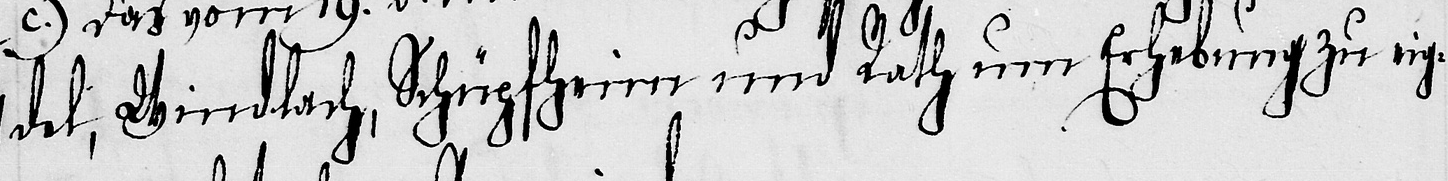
adel, Windlach, Schüpfheim und Rath um Erhebung zu ei¬
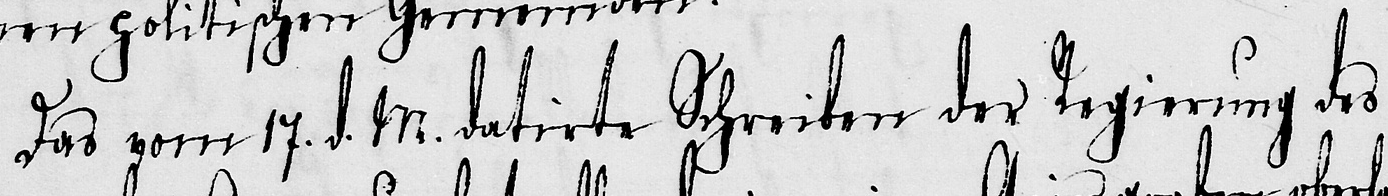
Das vom 17. d. M. datirte Schreiben der Regierung des
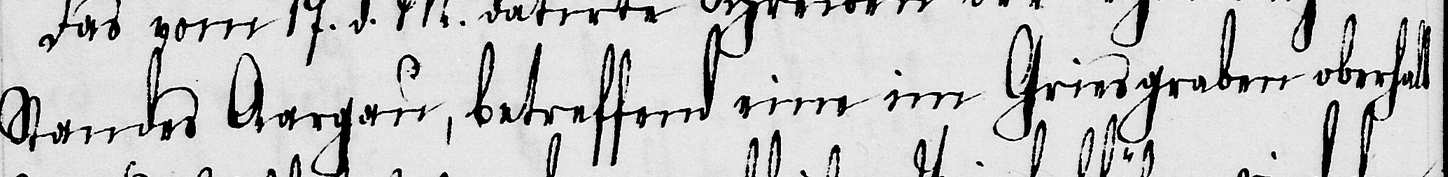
Standes Aargau, betreffend eine im Griesgraben oberhalb
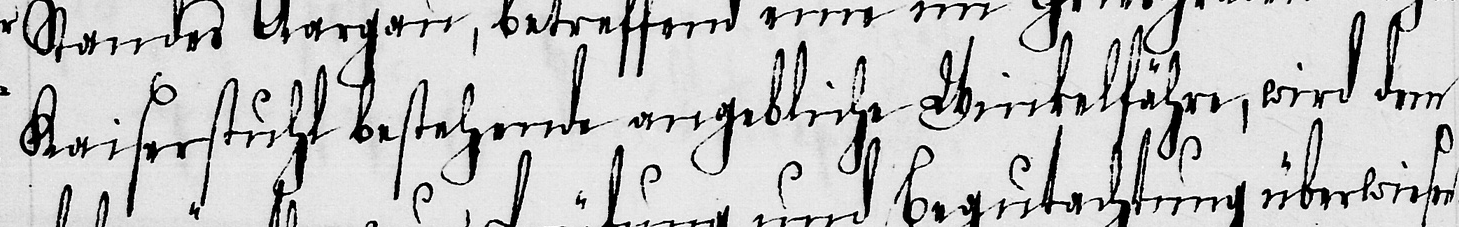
Kaiserstuhl bestehende angebliche Winkelfähre, wird dem
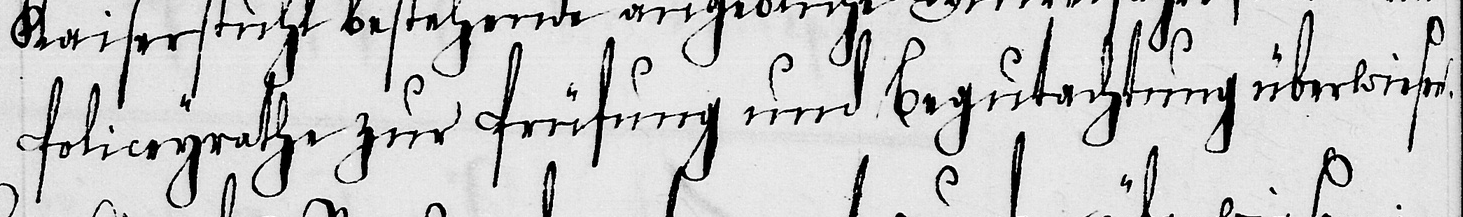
Policeyrathe zur Prüfung und Begutachtung überwiese¬
